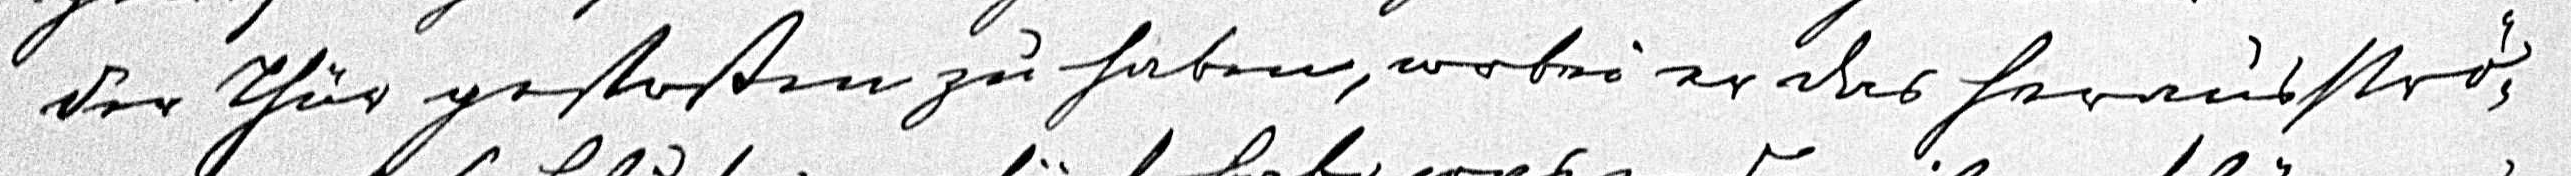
der Thür gestoßen zu haben, wobei er das herausströ¬
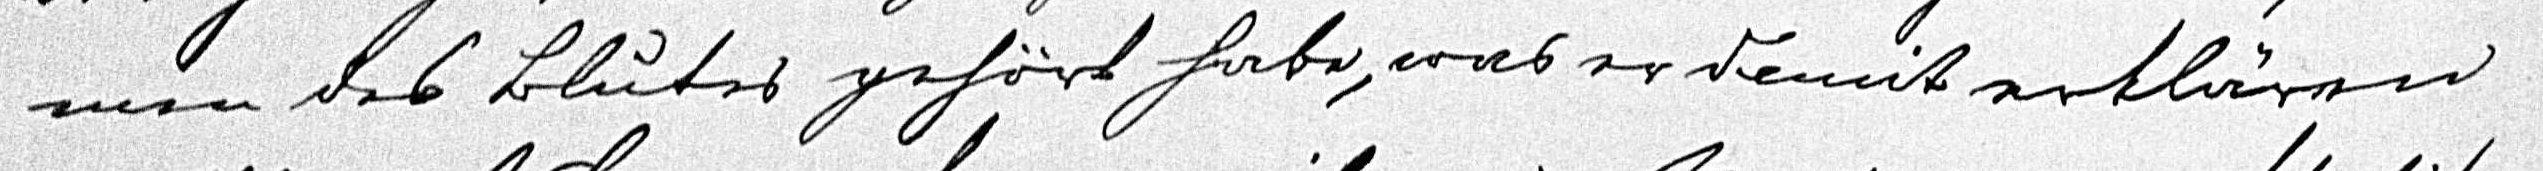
men des Blutes gehört habe, was er damit erklären
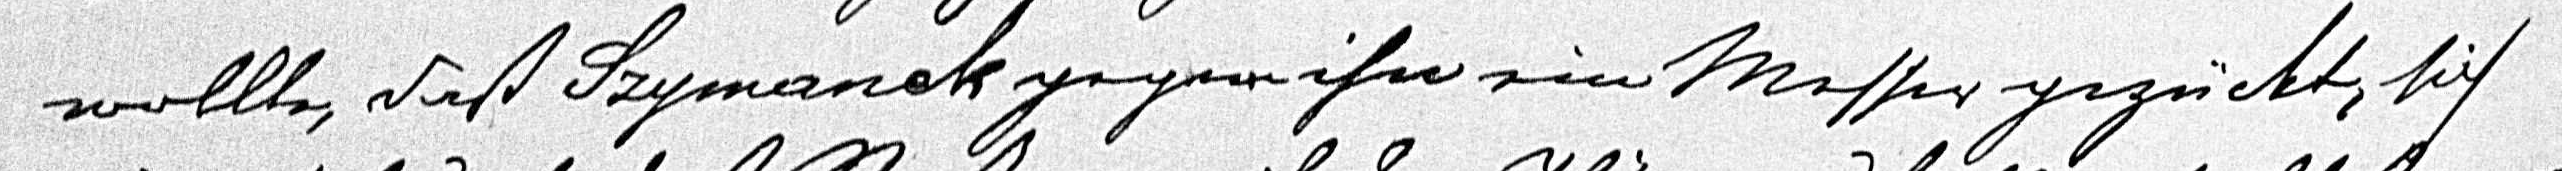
wollte, daß Szymanek gegen ihn ein Messer gezückt, sich
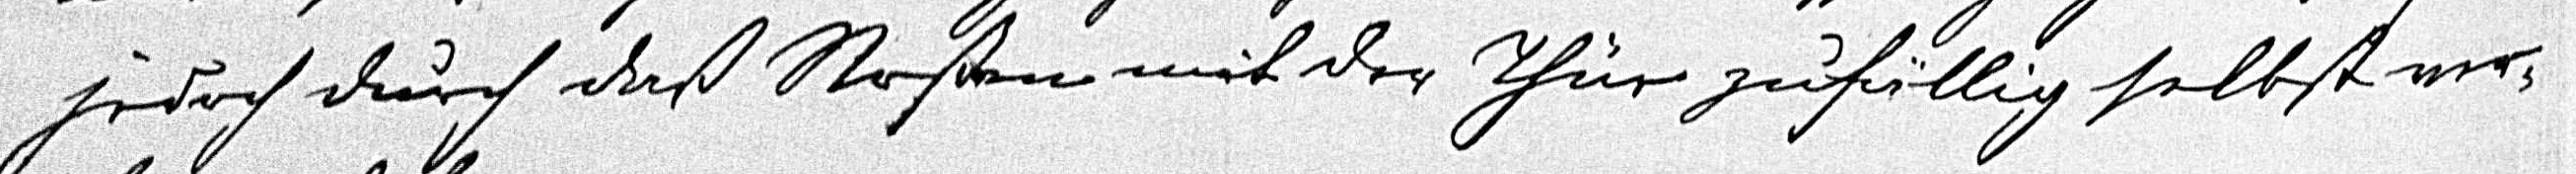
jedoch durch daß Stoßen mit der Thür zufällig selbst ver¬
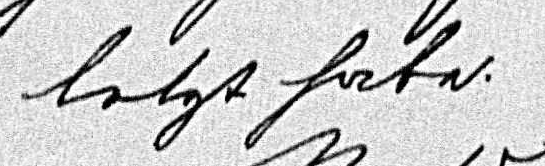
letzt habe.
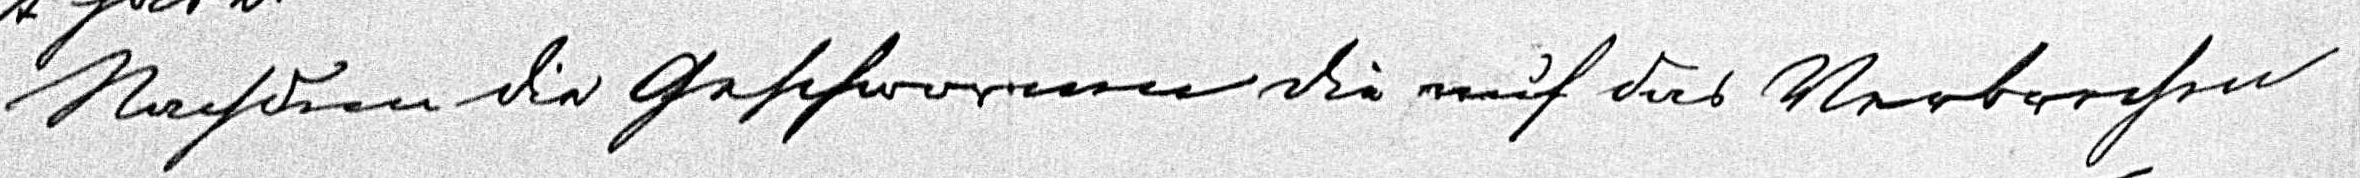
Nachdem die Geschworenen die auf das Verbrechen
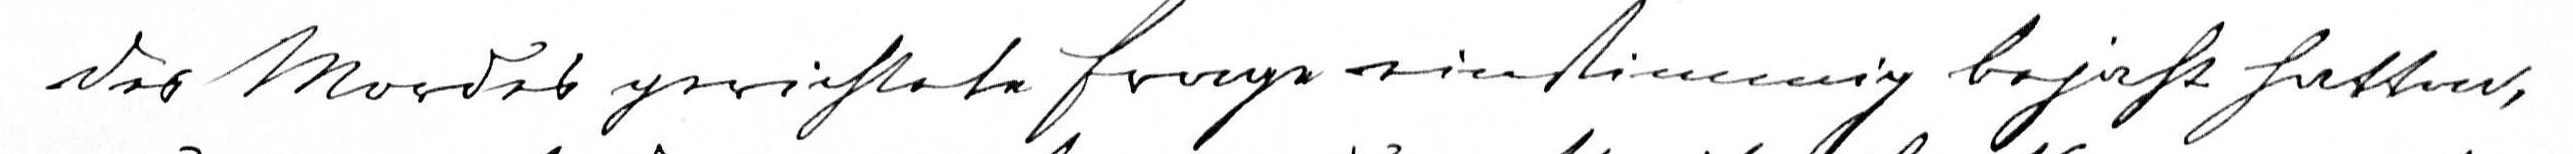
des Mordes gerichtete Frage einstimmig bejaht hatten,
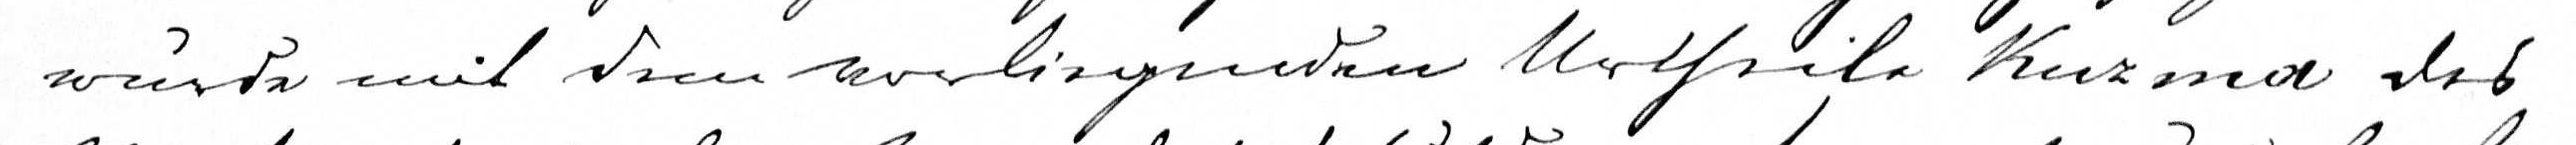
wurde mit dem vorliegenden Urtheil Kuźma des
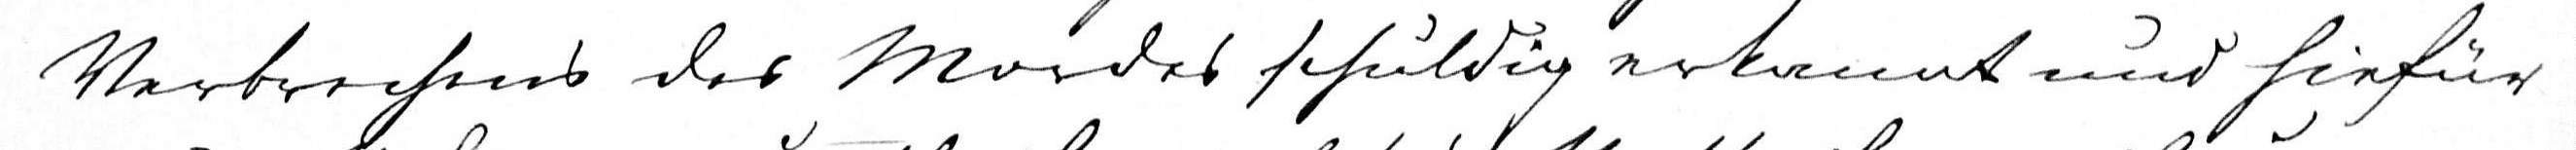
Verbrechens des Mordes schuldig erkannt und hiefür
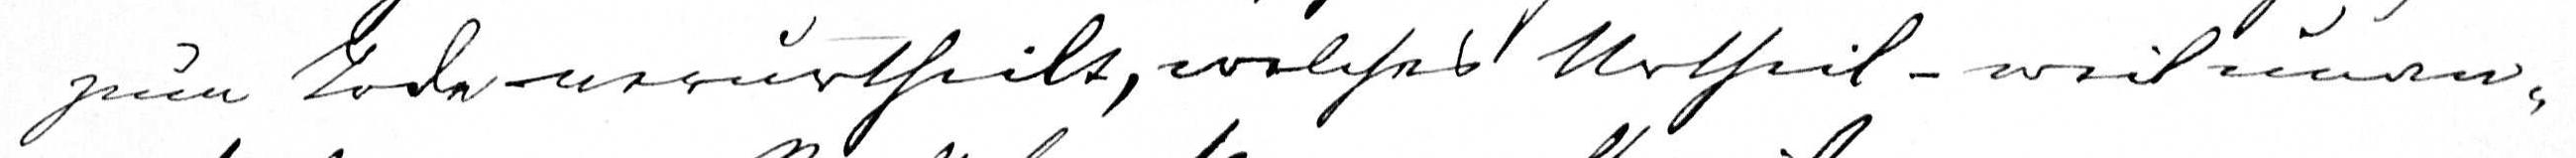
zum Tode verurtheilt, welches Urtheil – weil unan¬
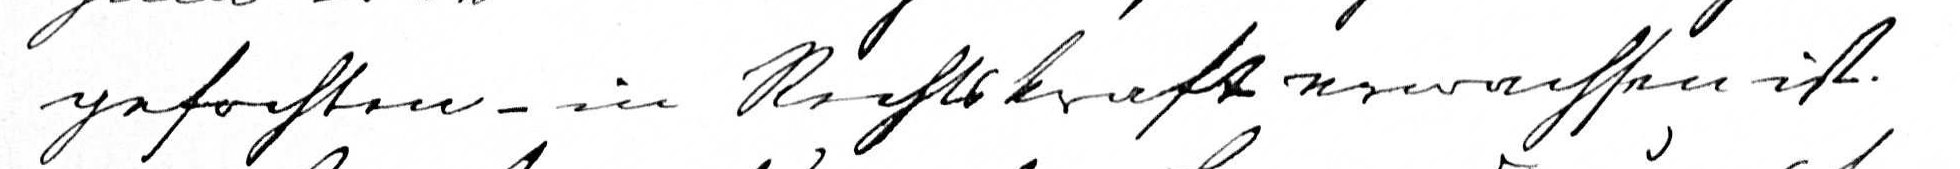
gefochten – in Rechtskraft erwachsen ist.
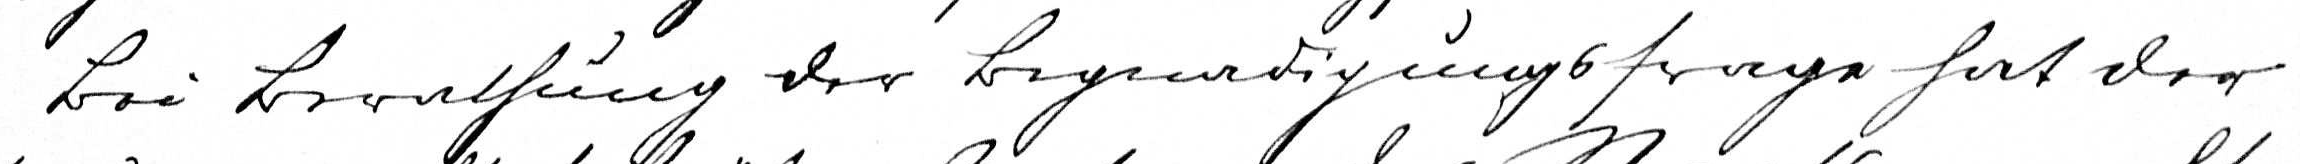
Bei Berathung der Begnadigungsfrage hat der
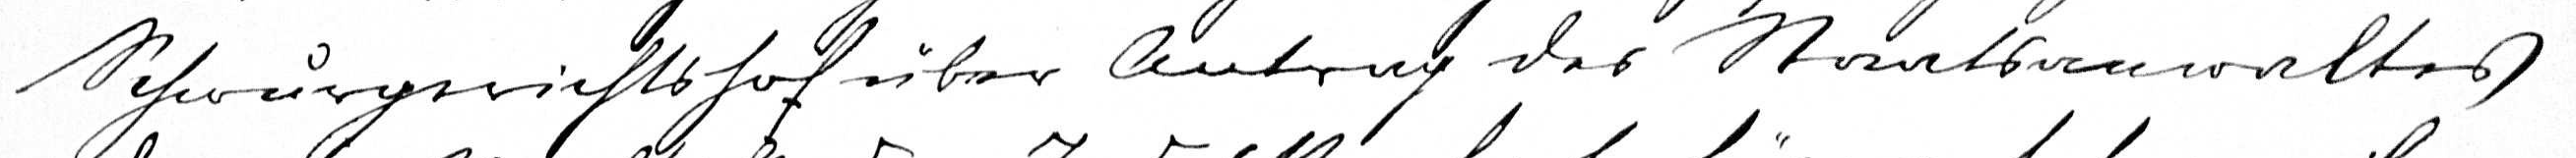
Schwurgerichtshof übe Antrag des Staatsanwaltes
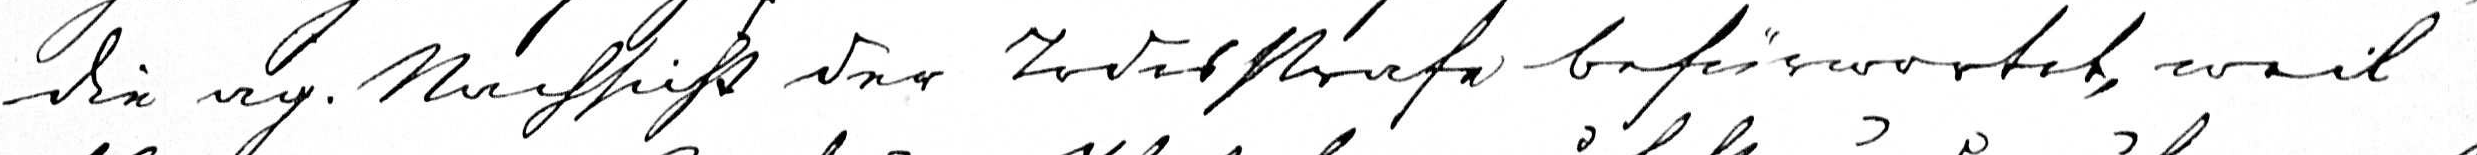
die ag Nachsicht der Todesstrafe befürwortete, weil
